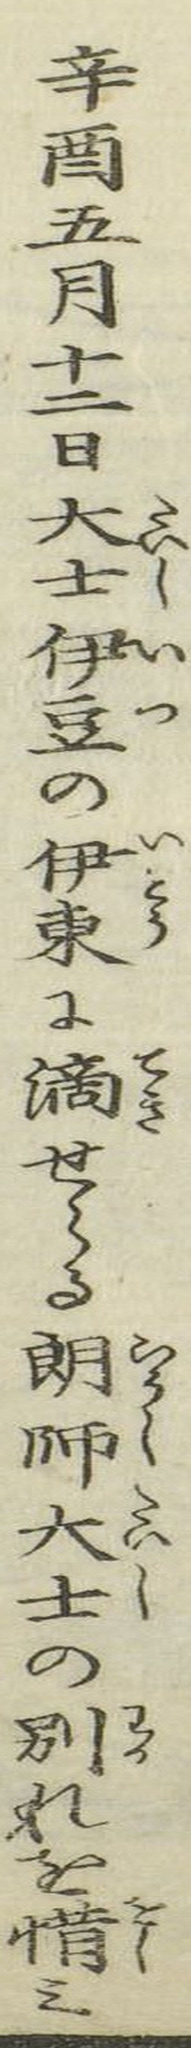辛酉五月十二日大士伊豆の伊東に滴せらる朗師大士の別れを惜み
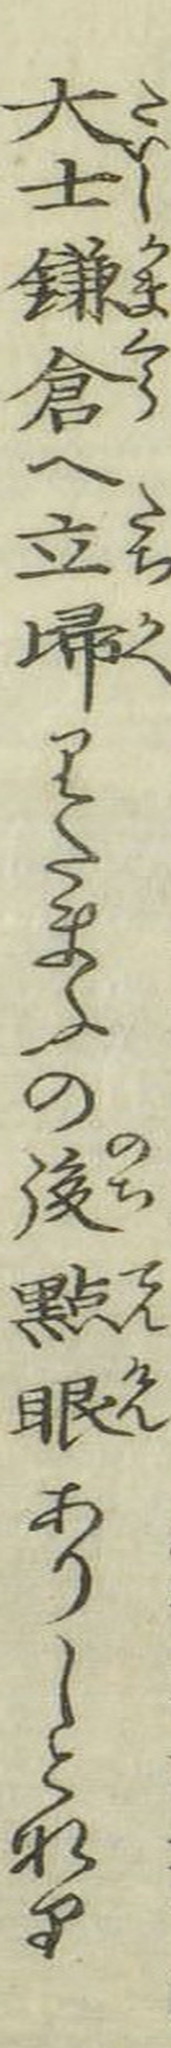大士鎌倉へ立帰りたまふの後点眼ありしとなり

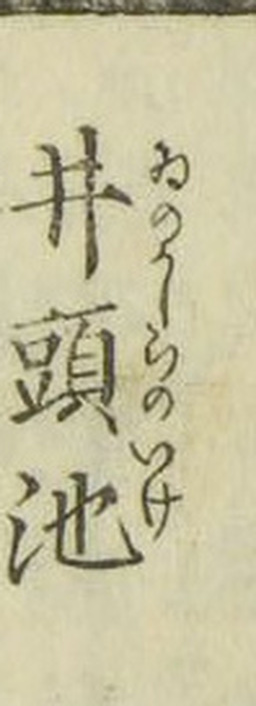井頭池
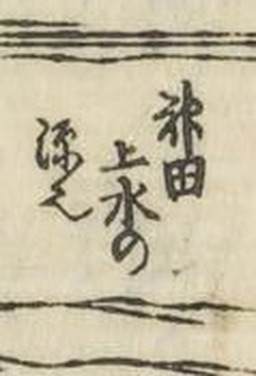上水の

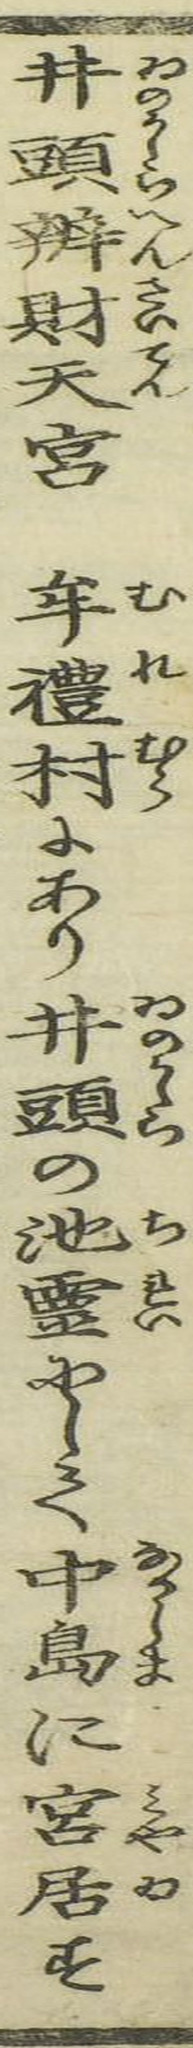井頭弁財天宮牟礼村にあり井頭の池霊にして中島に宮居す
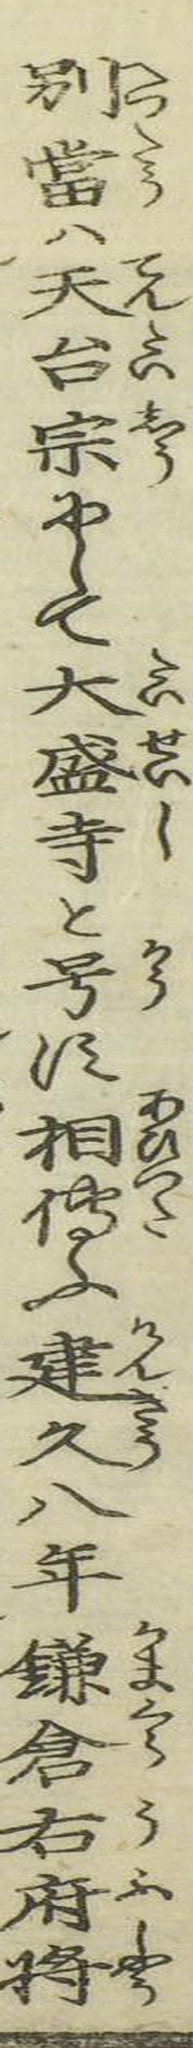別当は天台宗にして大盛寺と号す相伝ふ建久八年鎌倉右府将
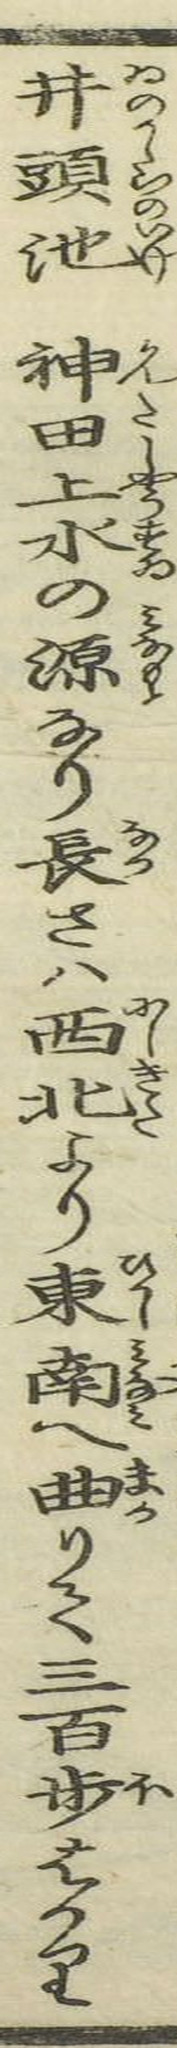井頭池神田上水の源なり長さは西北より東南へ曲りて三百歩はかり
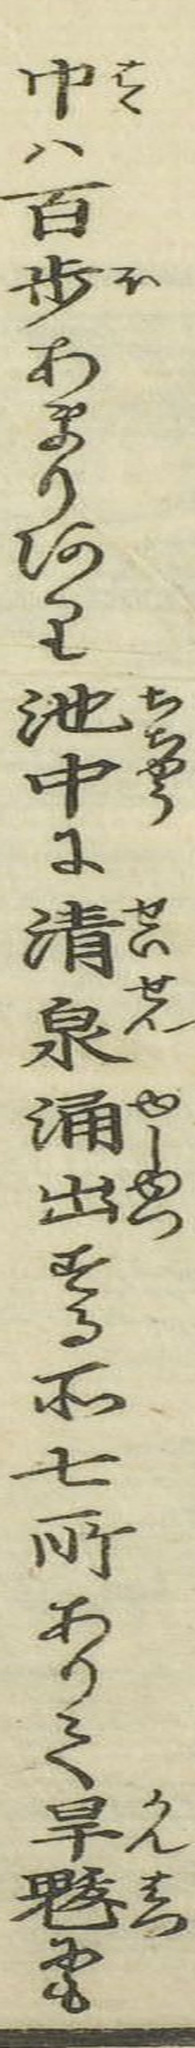幅は百歩あまりあり池中に清泉涌出する所七所ありて旱魃にも
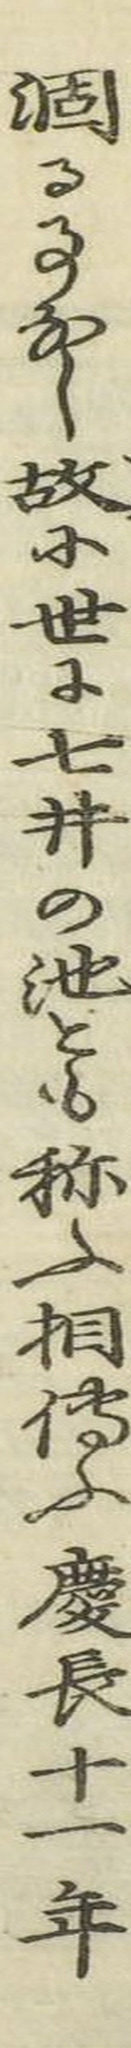涸る事なし故に世に七井の池とも称ふ相伝ふ慶長十一年
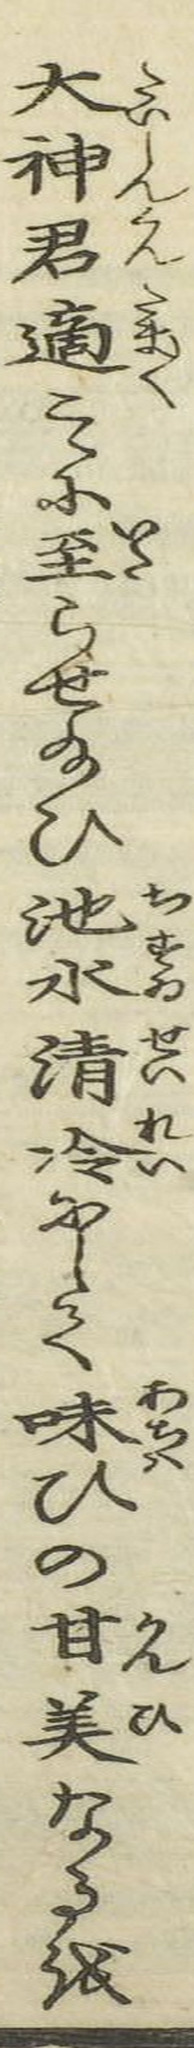大神君適こゝに至らせ給ひ池水清冷にして味ひの甘美なるを
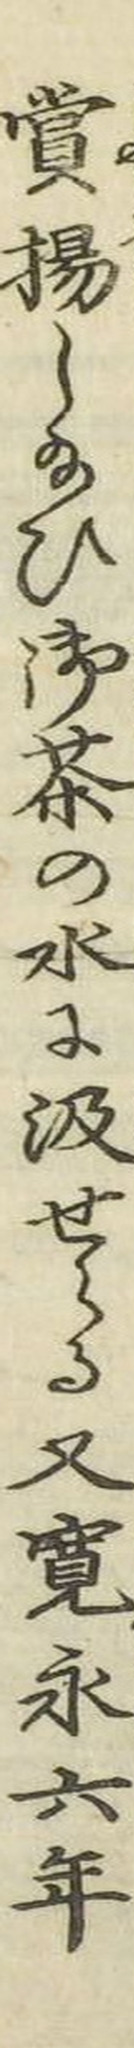賞揚し給ひ御茶の水に汲せらる又寛永六年
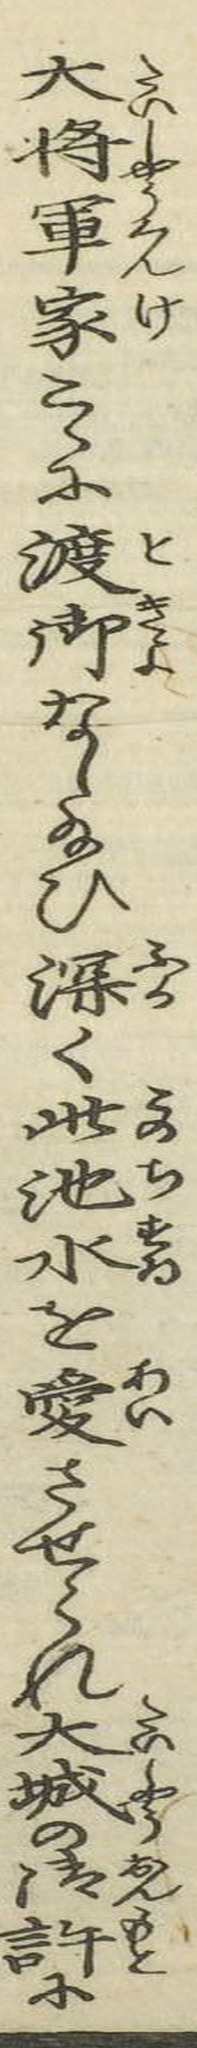大将軍家こゝに渡御なし給ひ深く此池水を愛させられ大城の御許に
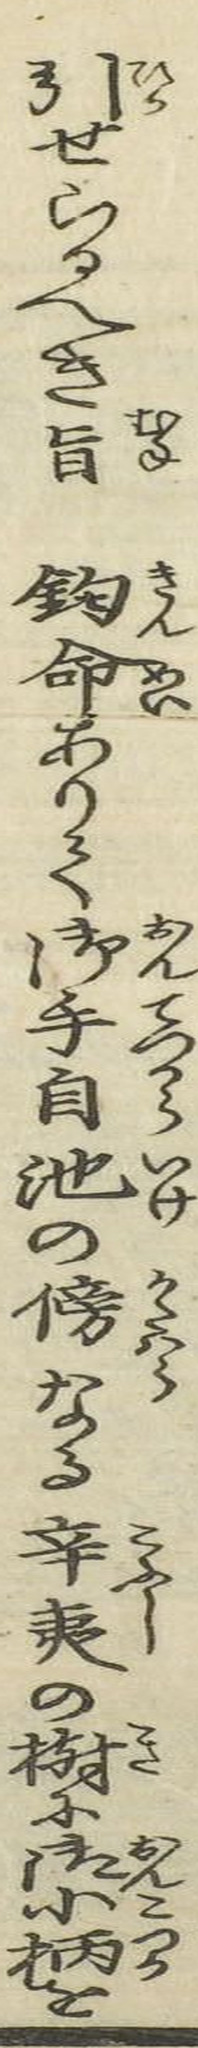引せらるへき旨鈞命ありて御手自池の傍なる辛夷の樹に御小柄を
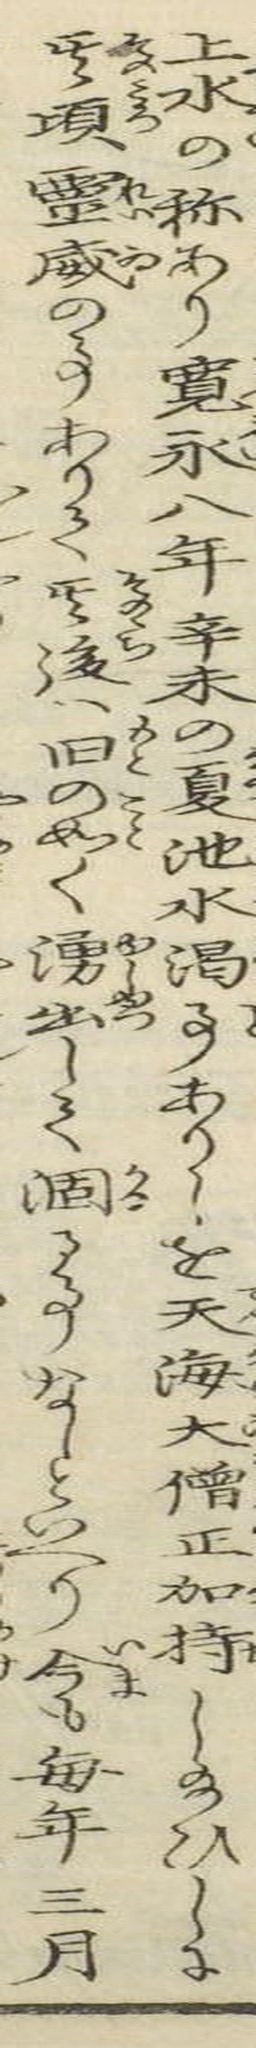其頃霊威の事ありて其後は旧の如く湧出して涸る事なしといへり今も毎年三月
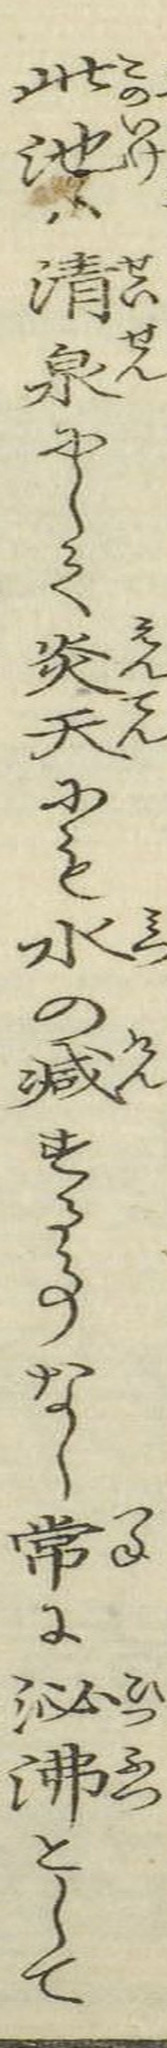此池は清泉にして炎天にも水の減する事なし常に泌沸として
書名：江戸名所図会 20巻 巻之11
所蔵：東京学芸大学教育コンテンツアーカイブ
